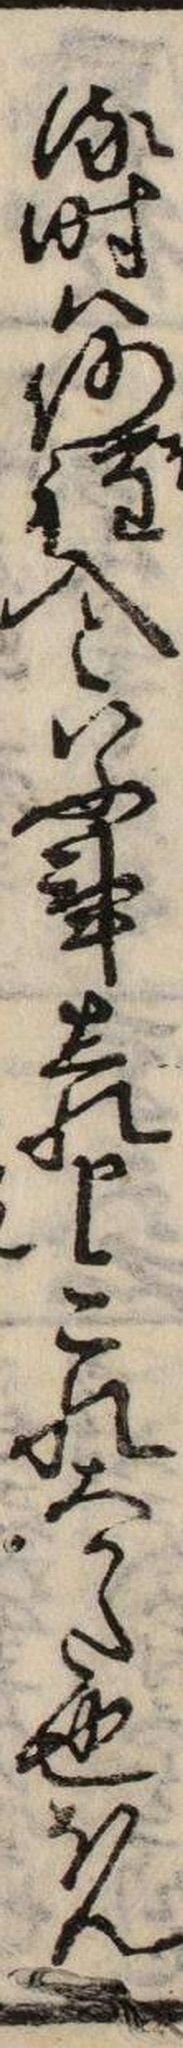る時は何程入といふ事しれ申候これ大かた也ほん
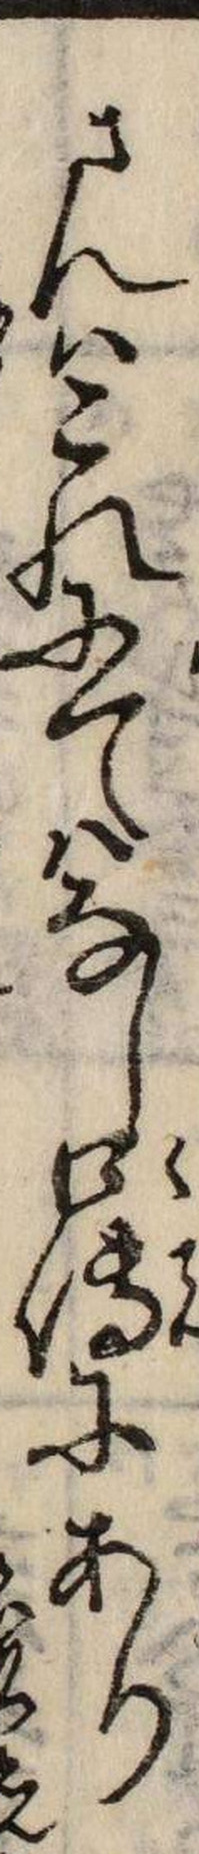さんはこれにてはなし口伝にあり
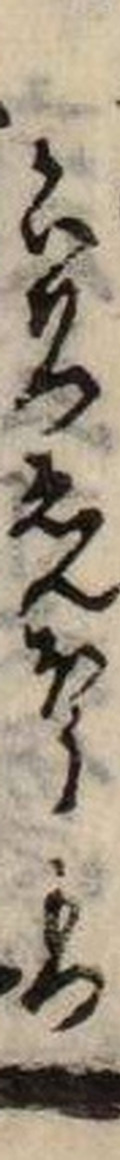かいもつゑんほうもつ
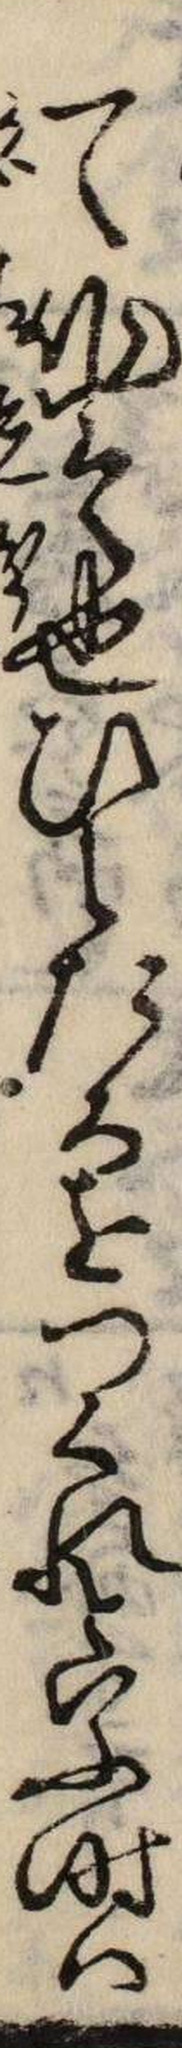て作之也ひらたるをつくれといふ時は
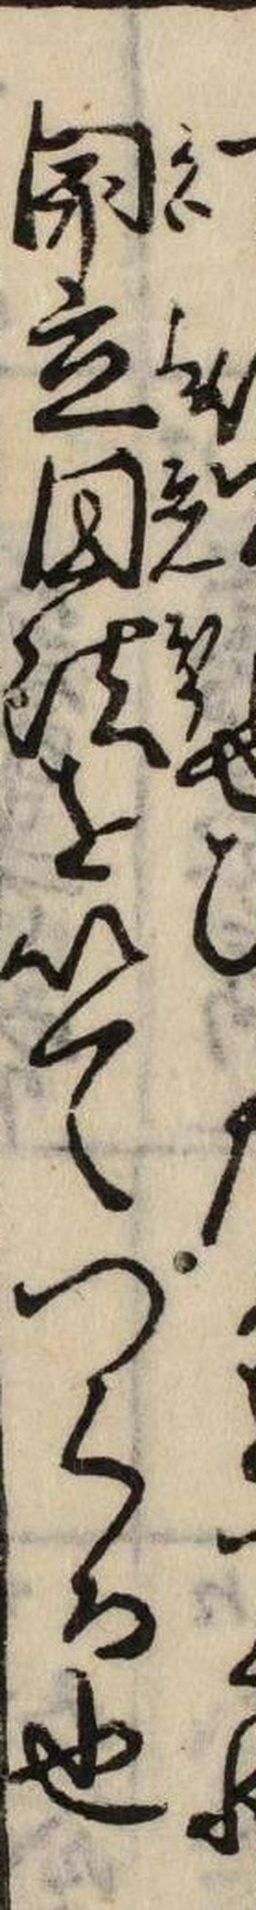開立円法を以てつくる也
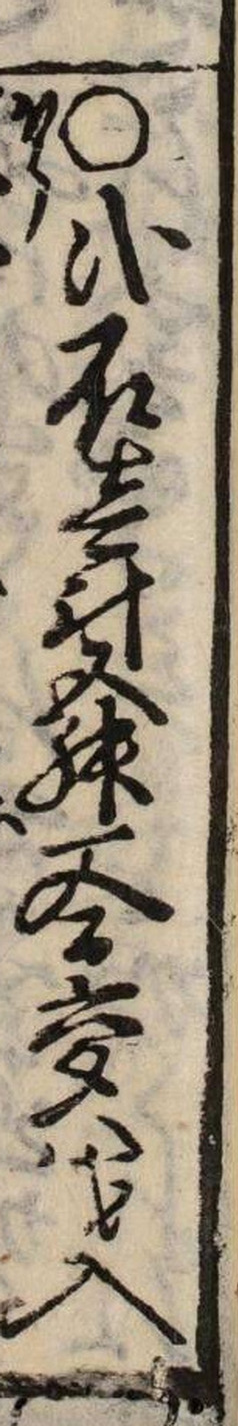○弐石壱斗五升一合六勺八才入
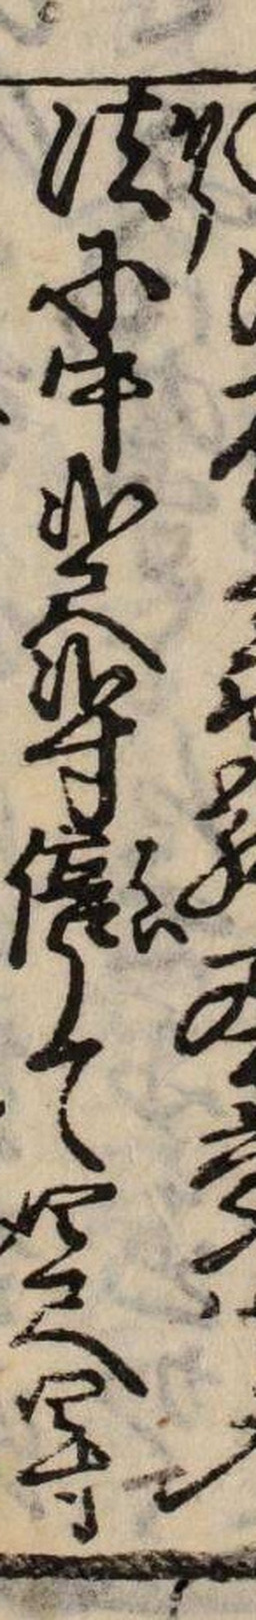法に中弐尺弐寸倍して四尺四寸
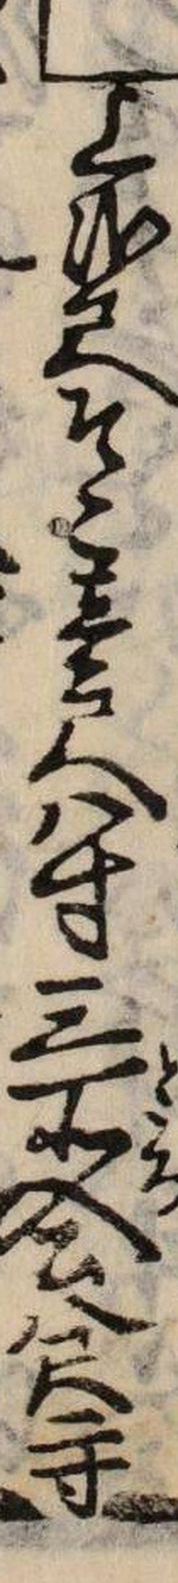上弐尺そこ壱尺八寸三所合八尺二寸
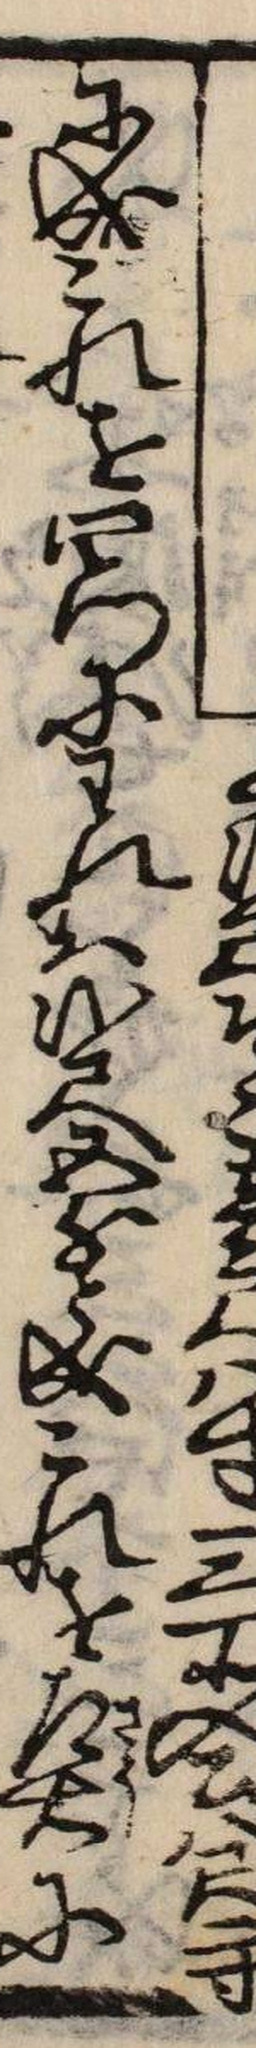に成これを四つにわれは弐尺五分と成これを左右に
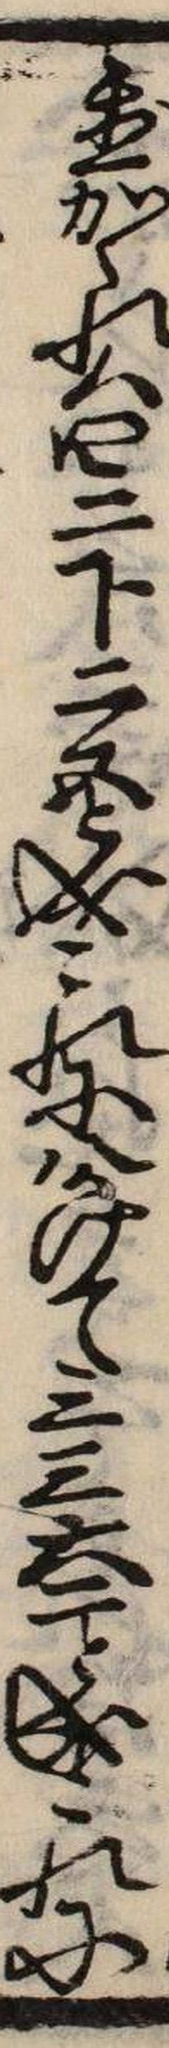置かくれは四二下二五と成これに八かけて三三六二と成これに
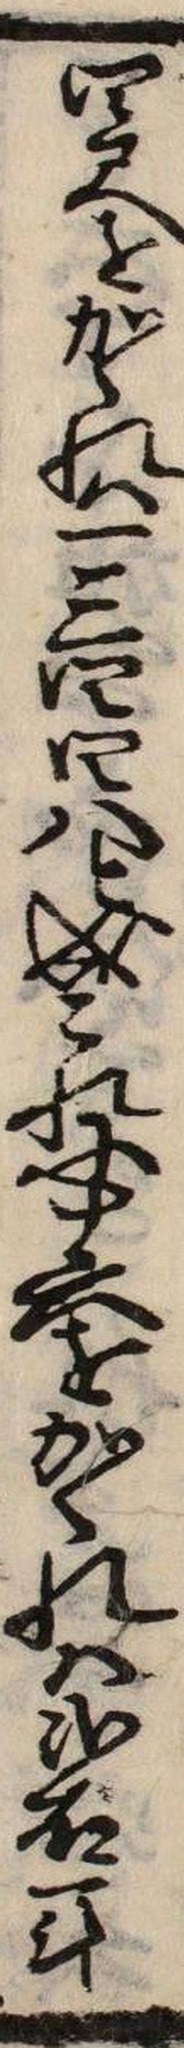四尺をかくれは一三四四八と成これに十六をかくれは弐石一斗
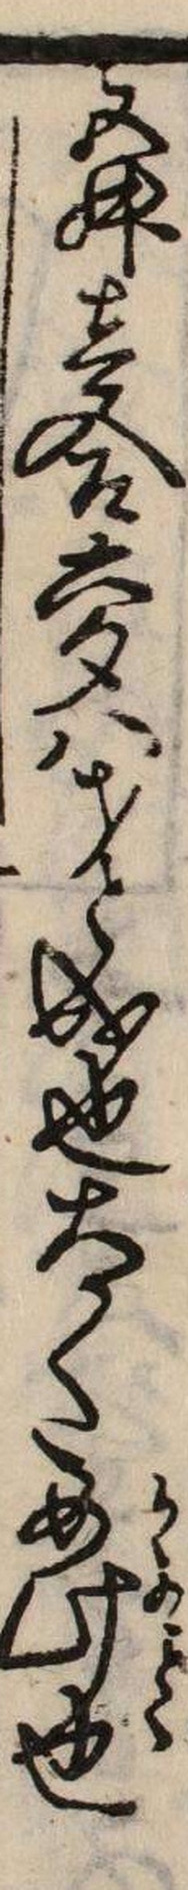五升壱合六勺八才と成也大かた如此也
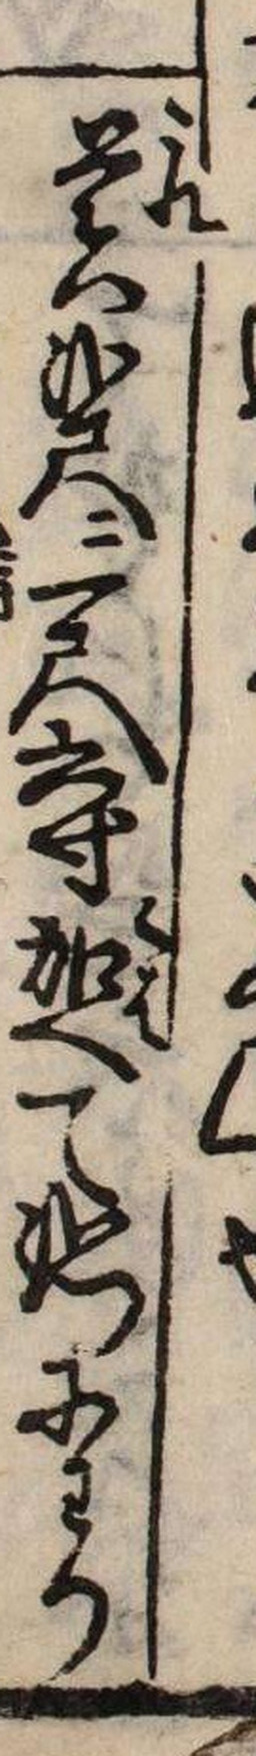是は弐尺に一尺六寸加へて弐つにわり
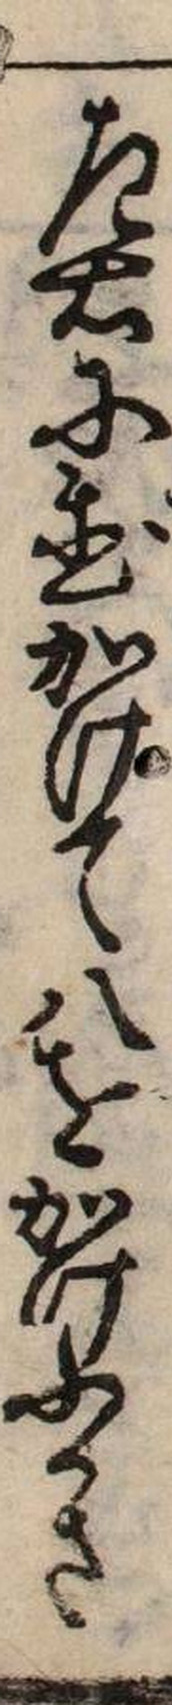左右に置かけて八をかけふかさ
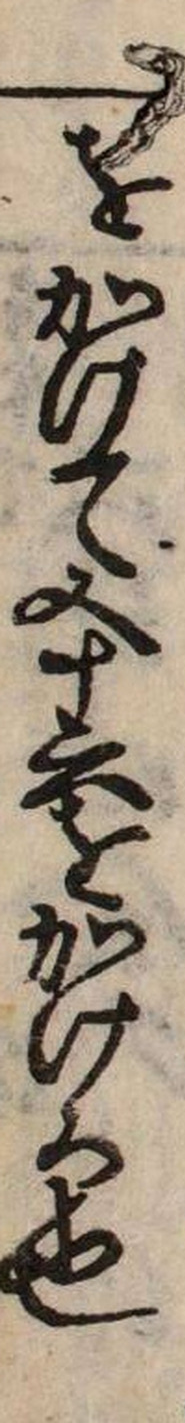をかけて又十六をかける也

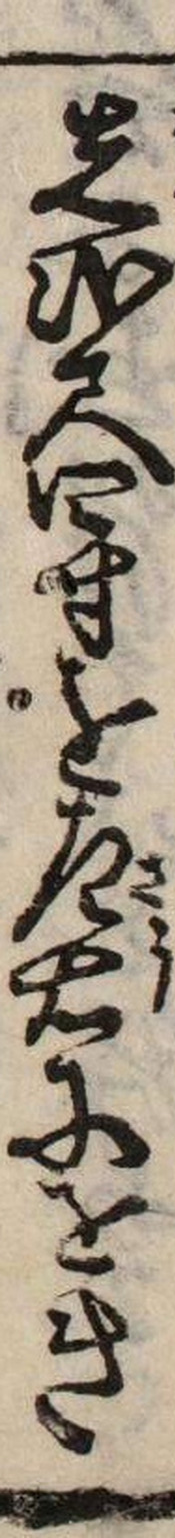先弐尺四寸を左右にをき
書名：塵劫記（寛永11年自跋、京都府立京都学・歴彩館追貴8）
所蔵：京都府立京都学・歴彩館 国文学研究資料館
